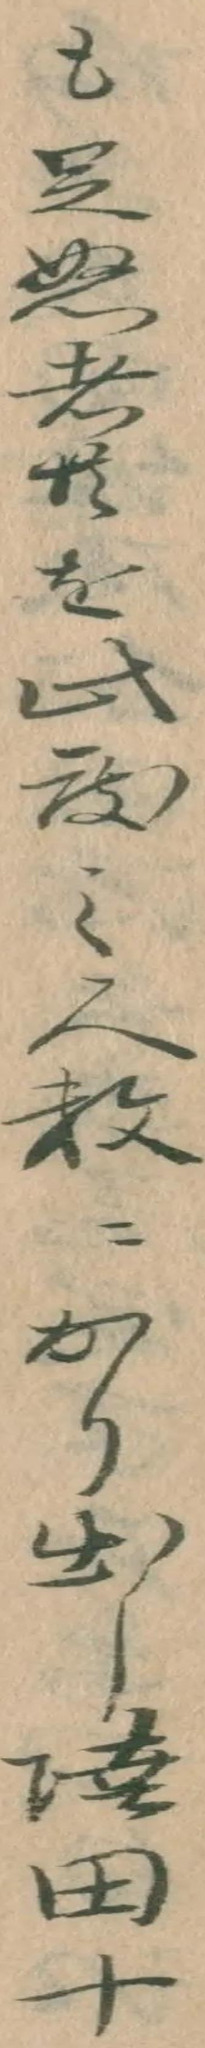も足怒者共を此度之人数にかり出し陸田十
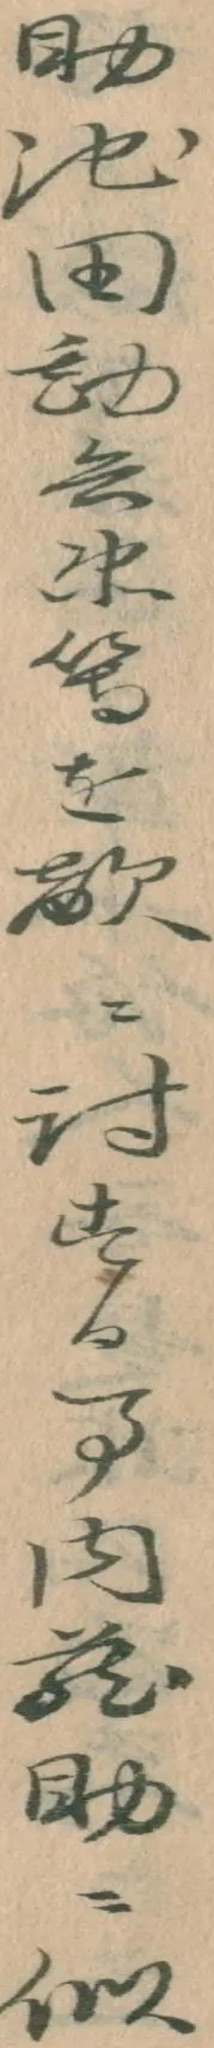助池田勘兵衛等を敵に討春る事内蔵助に似
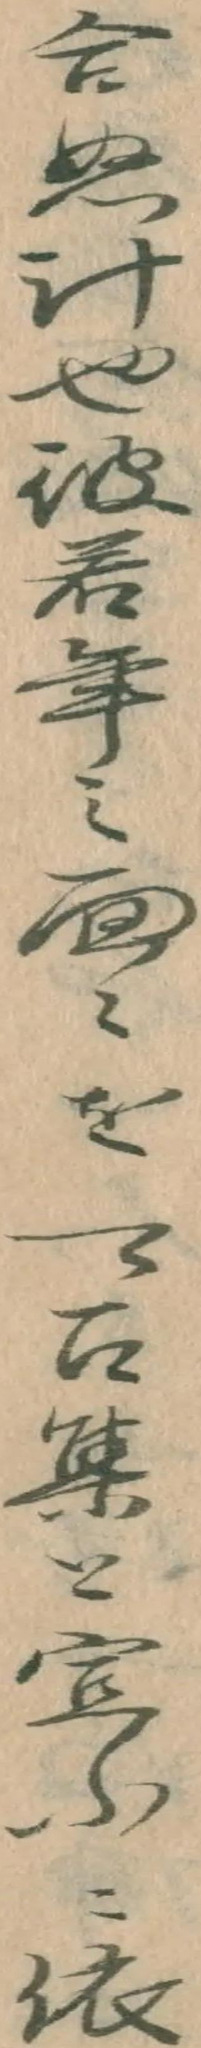合怒計や彼若年之面々を可召集と宣ふに依
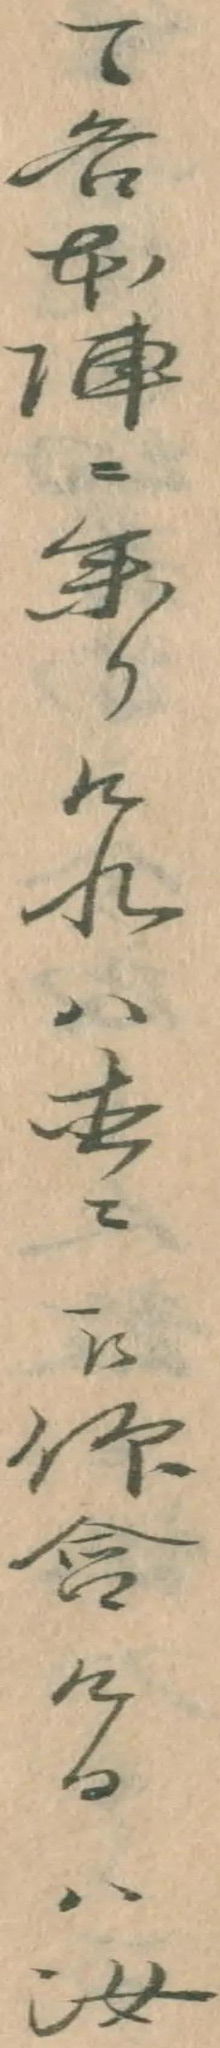て各本陣に参りけれは直に被仰含けるは汝

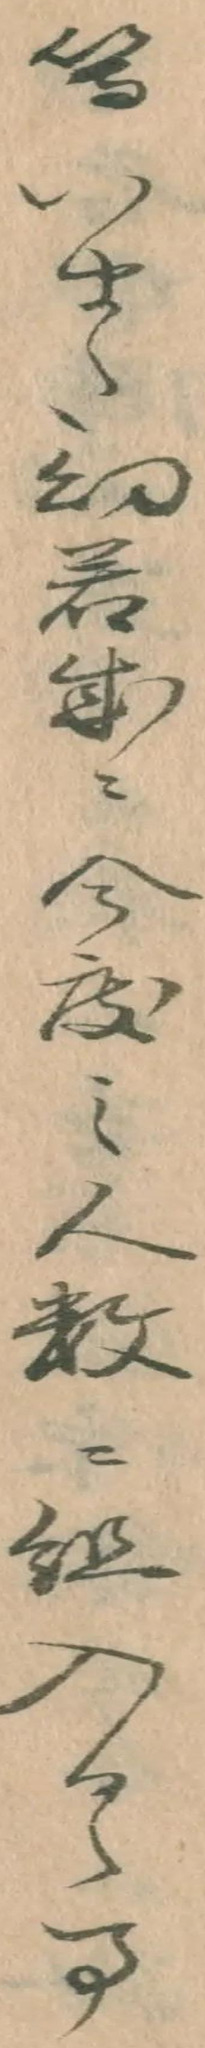等いまた幼若成に今度之人数に組入る候事
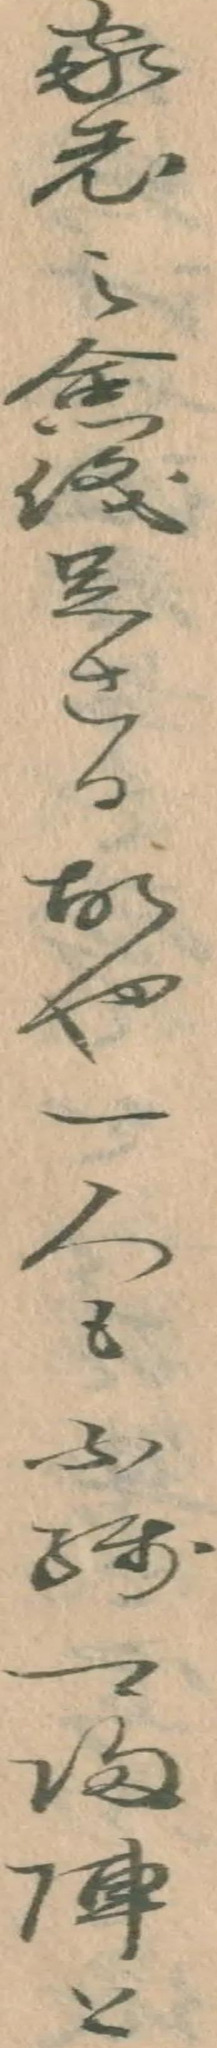家老之僉儀足さる故や一人も不残可帰陣と
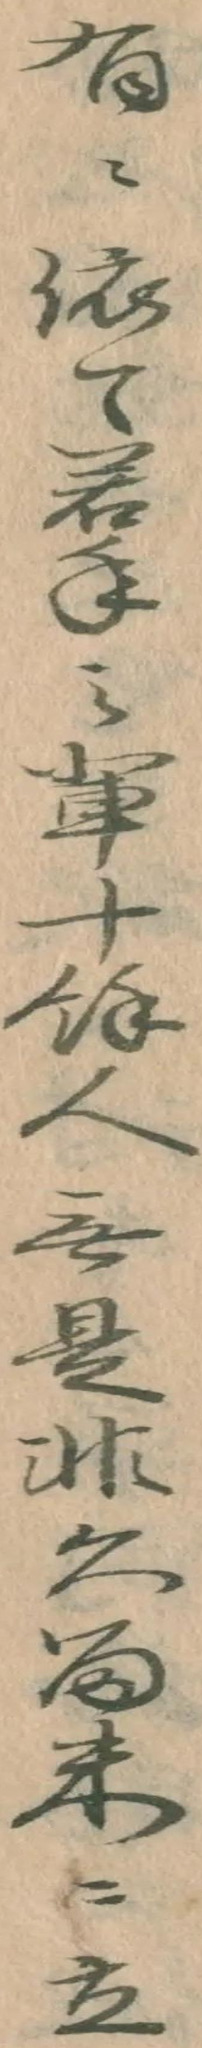有に依て若手之輩十余人無是非久留米に立
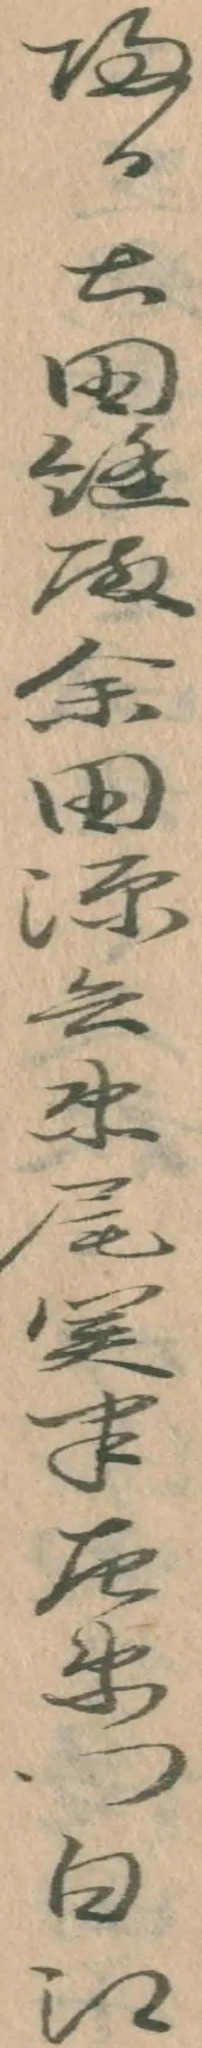帰る土田縫殿余田源兵衛尾関半左衛門白江
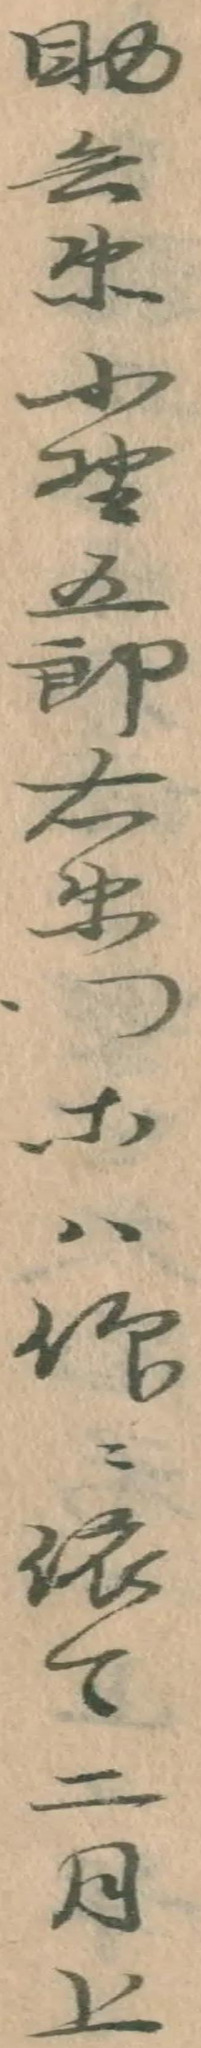助兵衛小野五郎右衛門等は仰に依て二月上
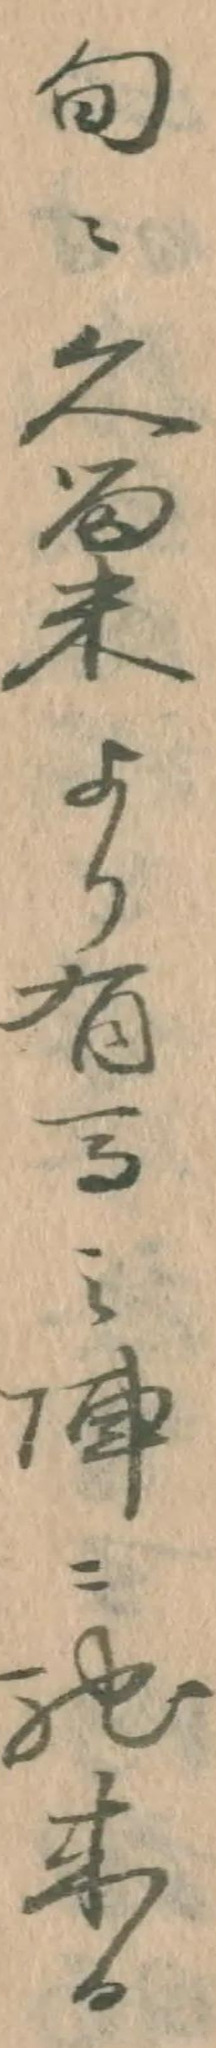旬に久留米より有馬之陣に馳来る
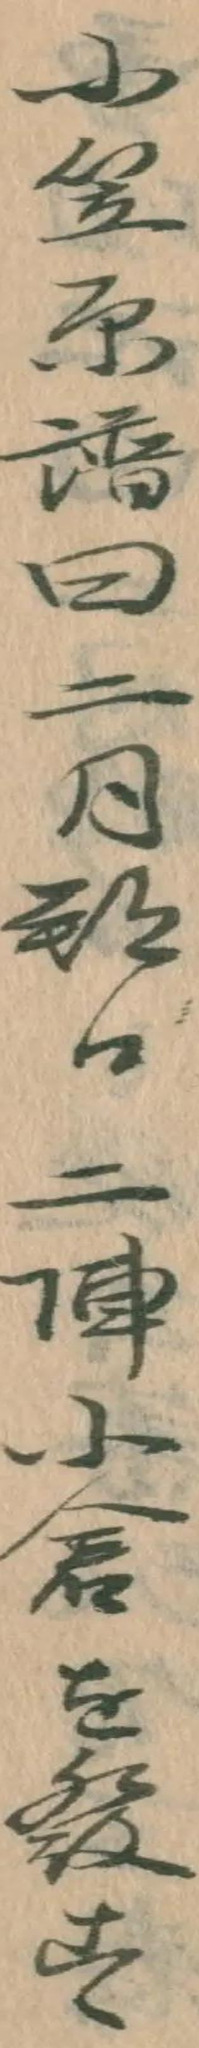小笠原譜曰二月朔日二陣小倉を発春
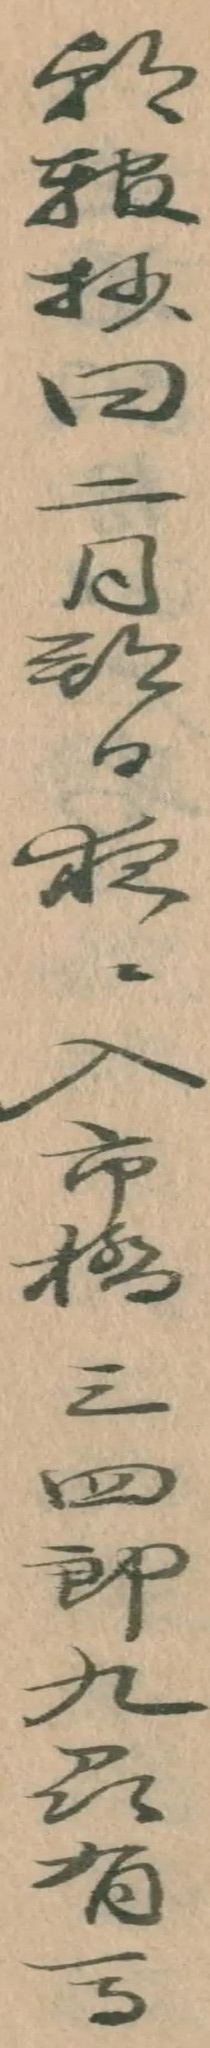朝報抄曰二月朔日夜に入市橋三四郎九州有馬
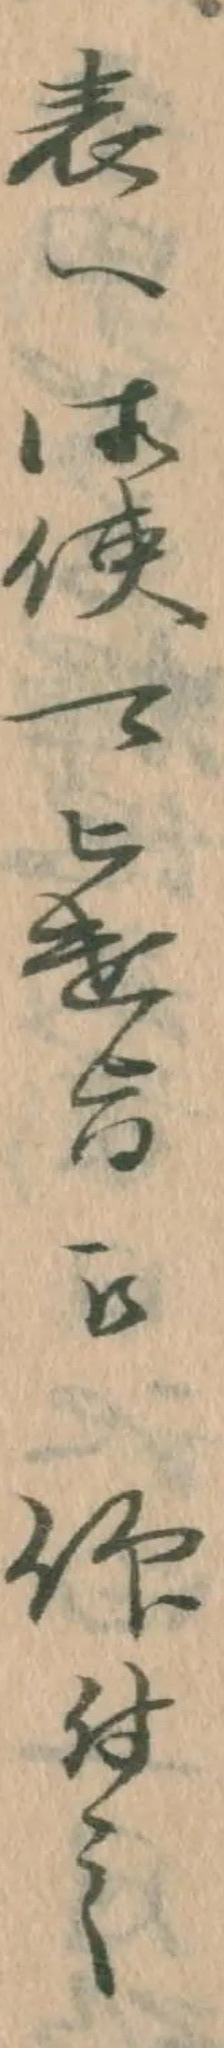表へ御使可被遣旨被仰付之
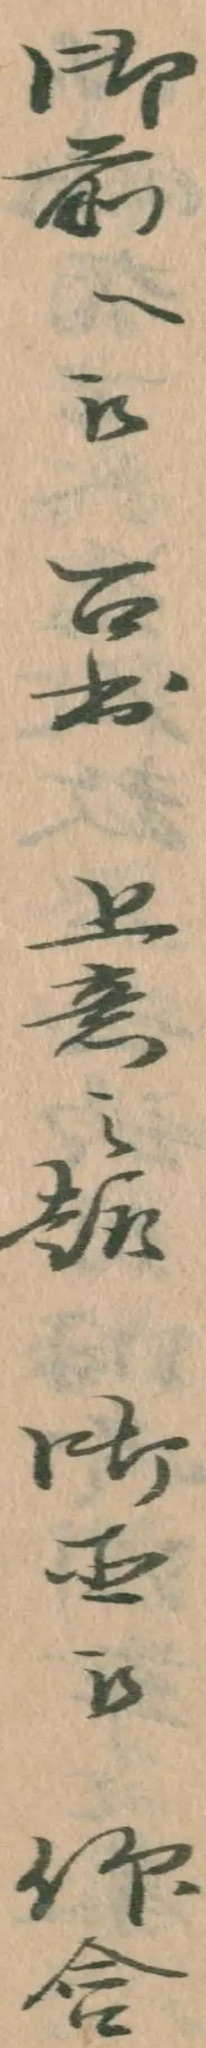御前へ被召出上意之趣御直被仰含
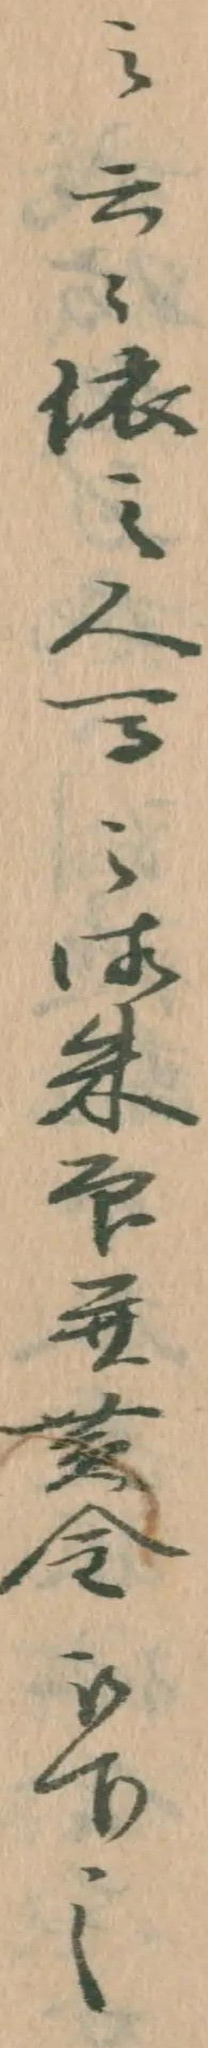之云々依之人馬之御朱印幷黄金被下之
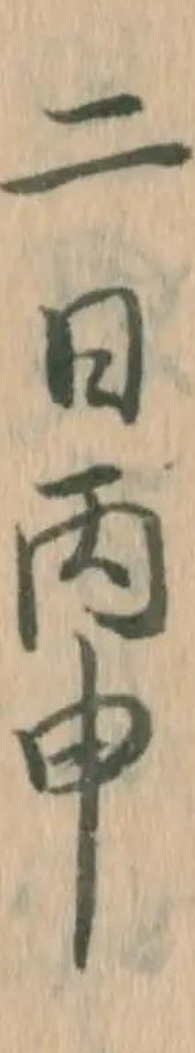二月丙申
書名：切支丹御退治記 49巻. [6]
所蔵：国立国会図書館 National Diet Library, JAPAN
